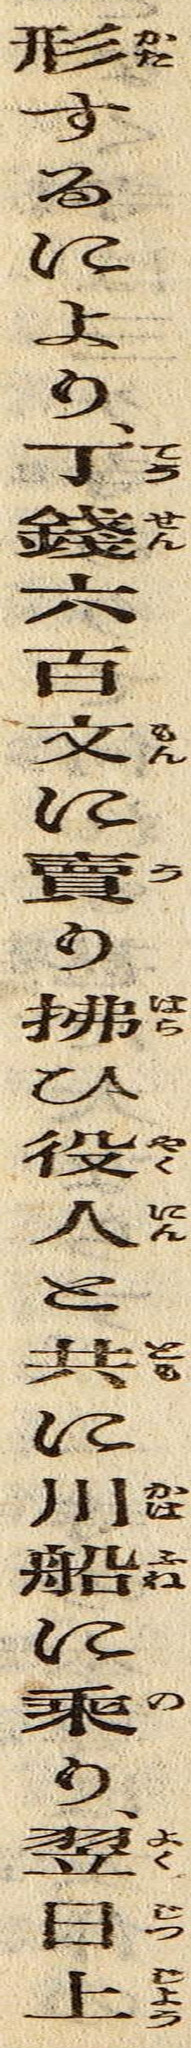形するにより、丁銭六百文に売り払ひ役人と共に川船に乗り、翌日上
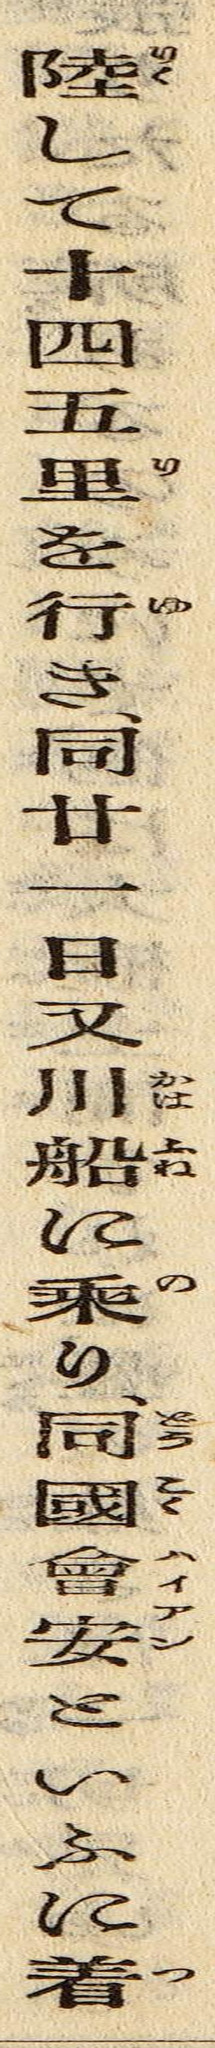陸して十四五里を行き、同廿一日又川船に乗り、同国会安といふに着
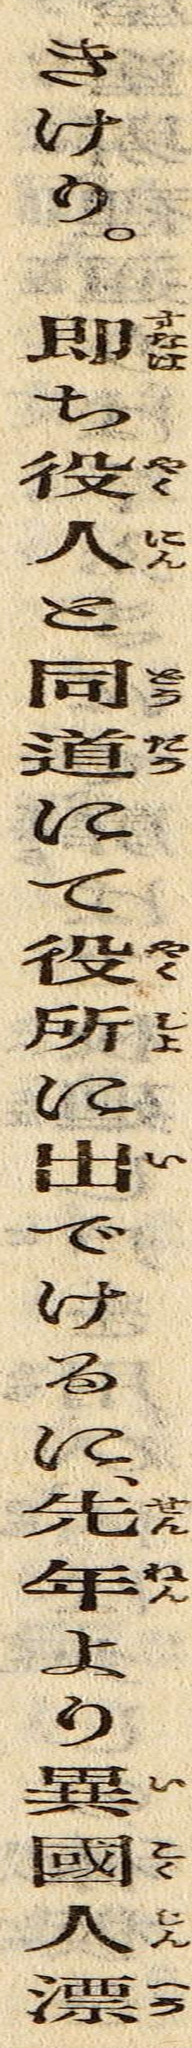きけり。即ち役人と同道にて役所に出でけるに、先年より異国人漂
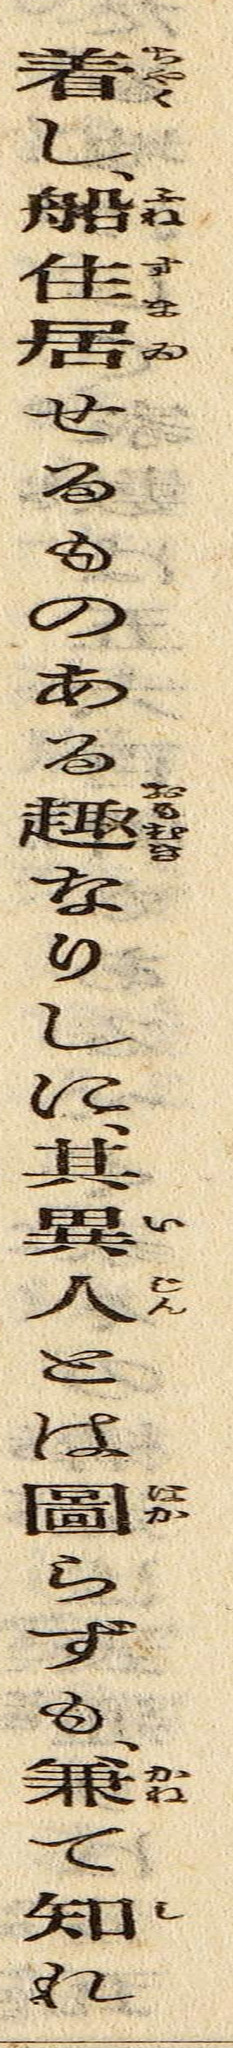着し、船住居せるものある趣なりしに、其異人とは図らずも、兼て知れ
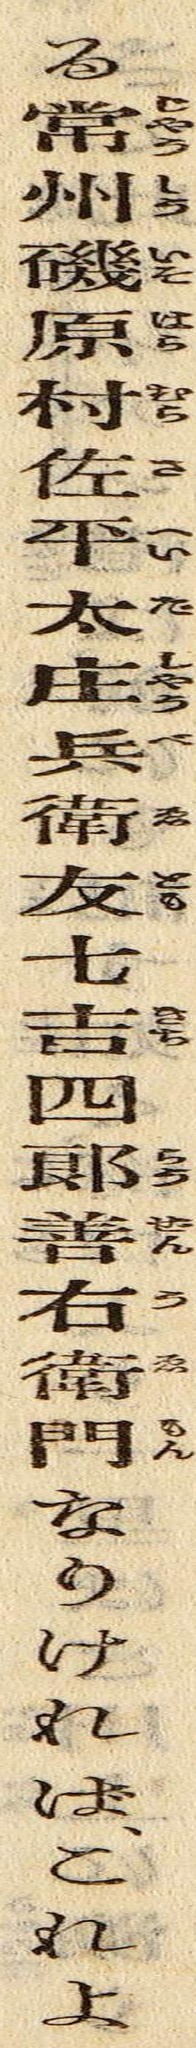る常州磯原村佐平太庄兵衛友七吉四郎善右衛門なりければ、これよ
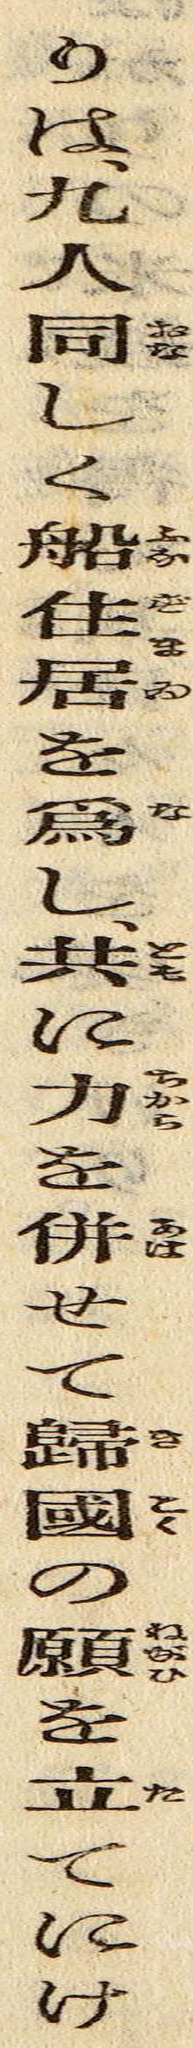りは、九人同しく船住居を為し、共に力を併せて帰国の願を立てにけ
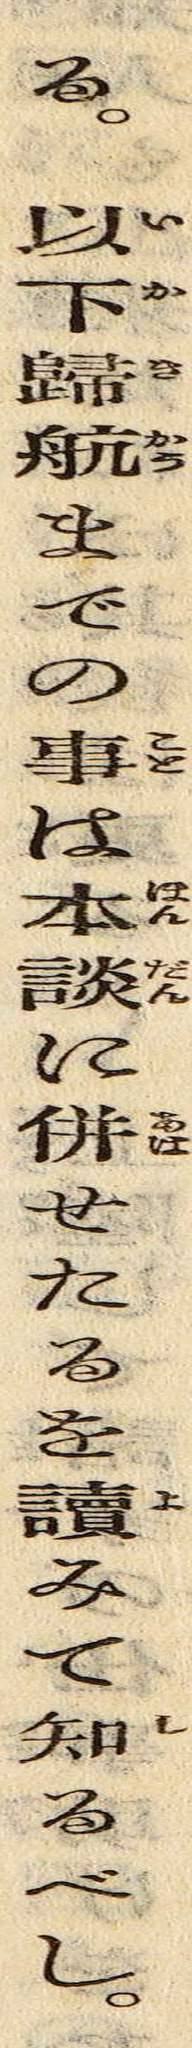る。以下帰航までの事は本談に併せたるを読みて知るべし。
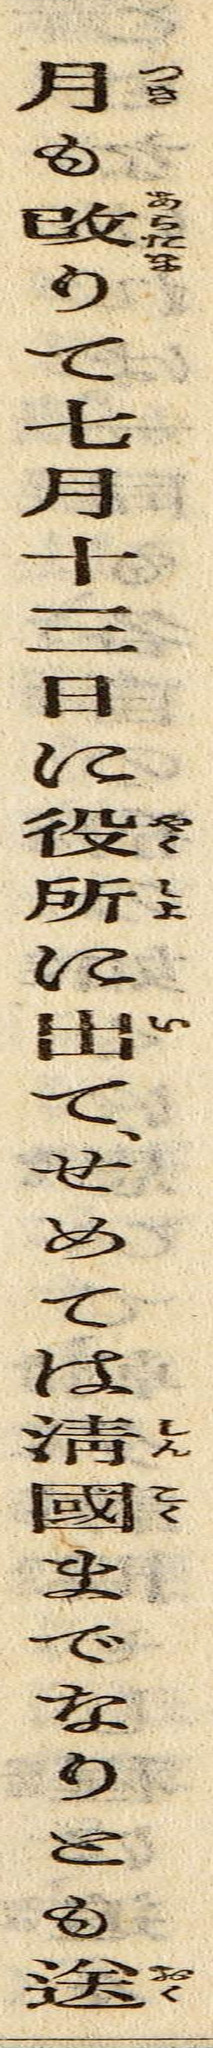月も改りて七月十三日に役所に出て、せめては清国までなりとも送
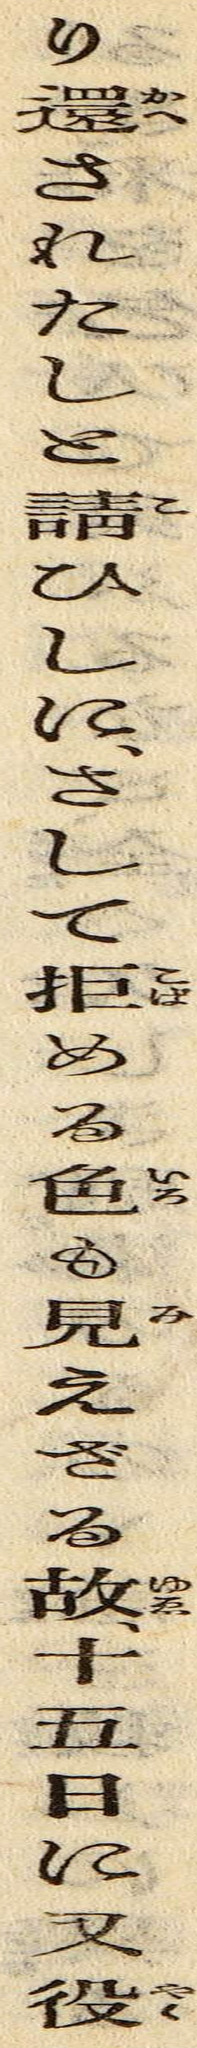り還されたしと請ひしに、さして拒める色も見えざる故、十五日に又役
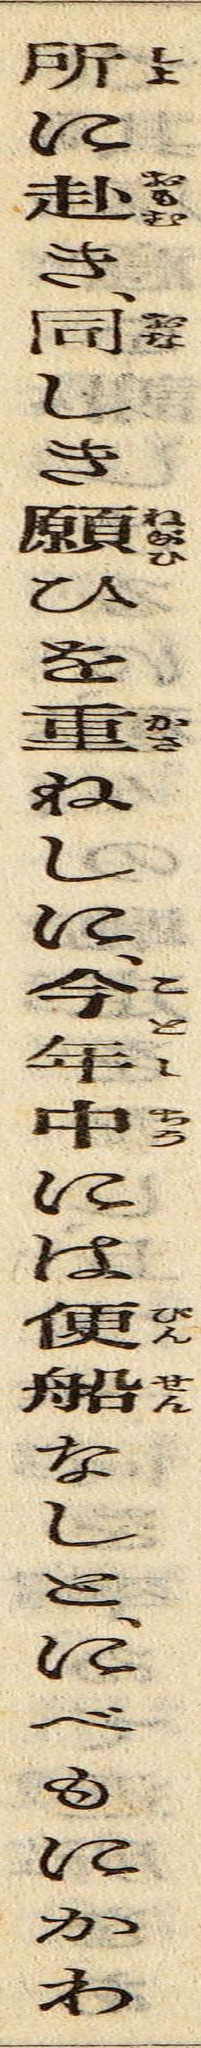所に赴き、同しき願ひを重ねしに、今年中には便船なしと、にべもにかわ
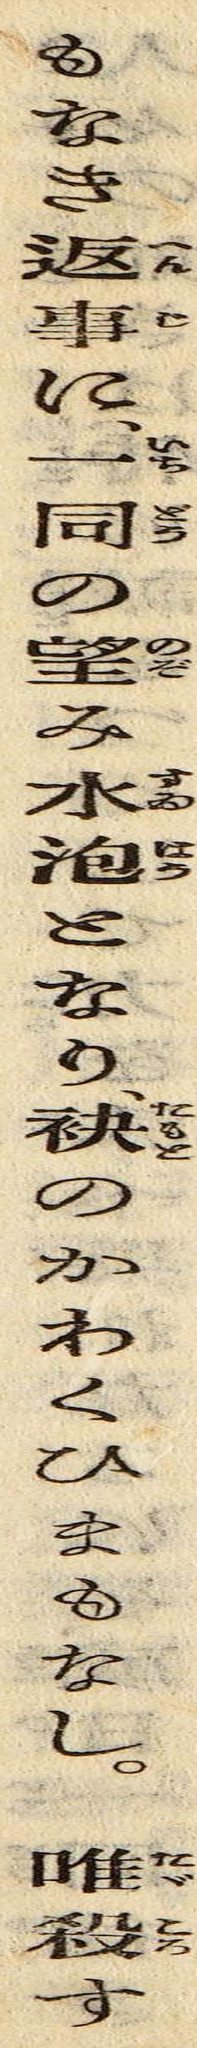もなき返事に、一同の望み水泡となり、袂のかわくひまもなし。唯殺す

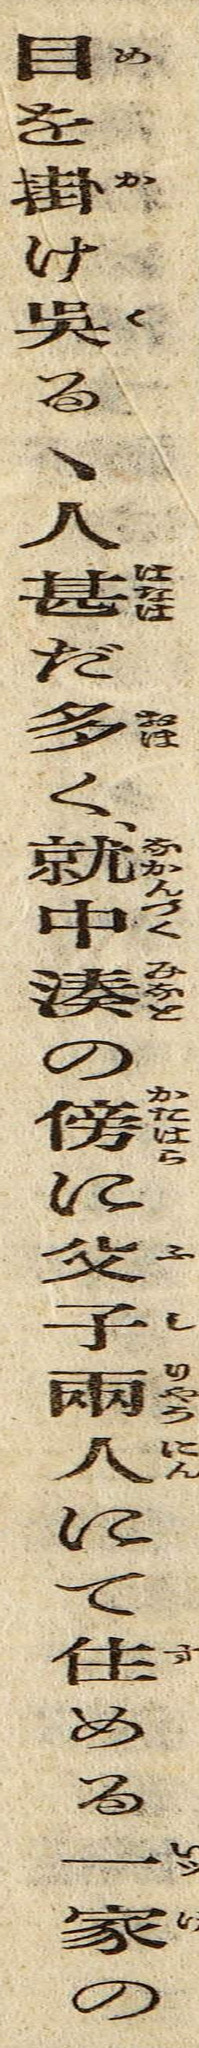目を掛け呉るヽ人甚だ多く、就中湊の傍に父子両人にて住める一家の
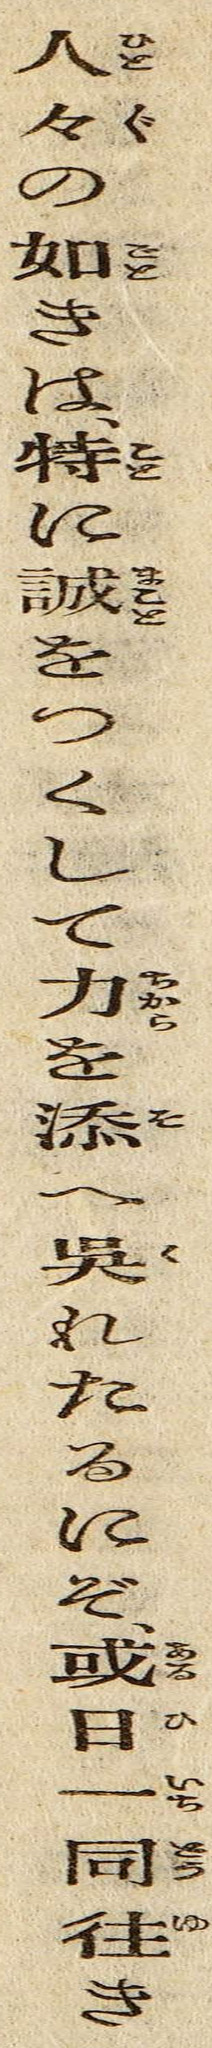人々の如きは、特に誠をつくして力を添へ呉れたるにぞ、或日一同往き
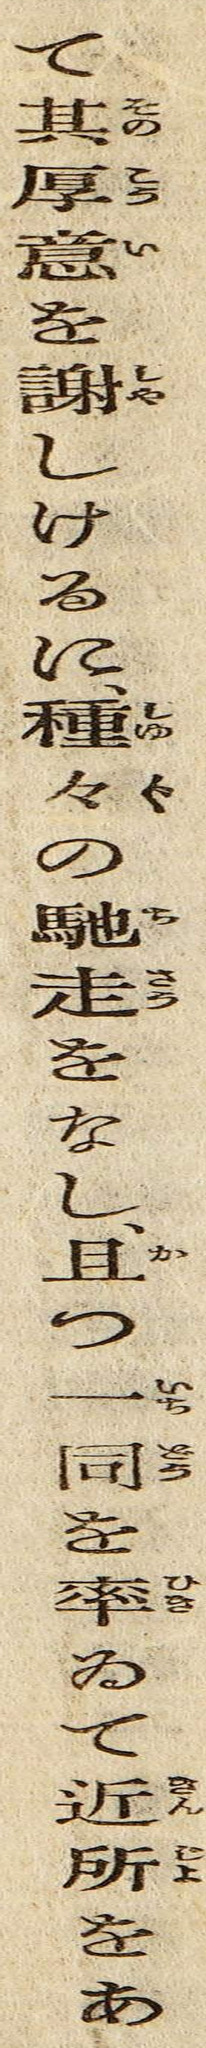て其厚意を謝しけるに、種々の馳走をなし、且つ一同を率ゐて近所をあ
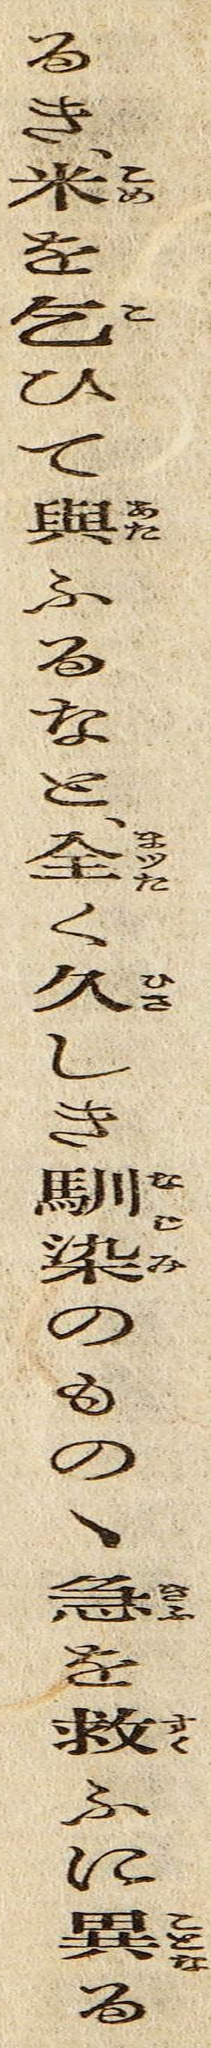るき、米を乞ひて与ふるなと、全く久しき馴染のものヽ急を救ふに異る
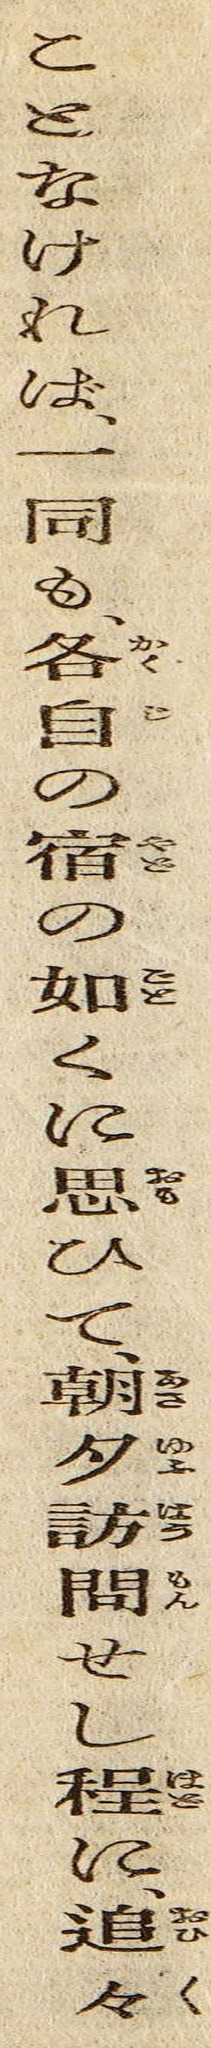ことなければ、一同も、各自の宿の如くに思ひて、朝夕訪問せし程に、追々
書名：日本漂流譚
